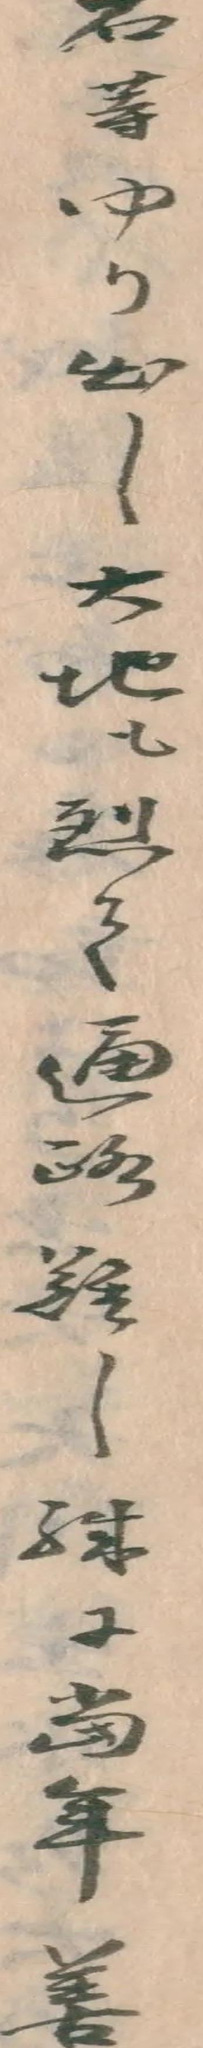石等ゆり出し大地も裂て通路難し殊に当年善
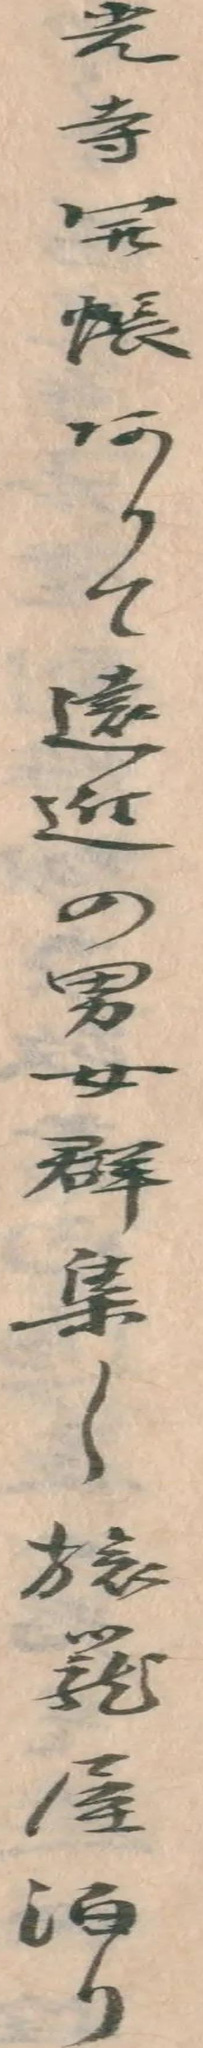光寺開帳ありて遠近の男女群集し旅籠屋泊り
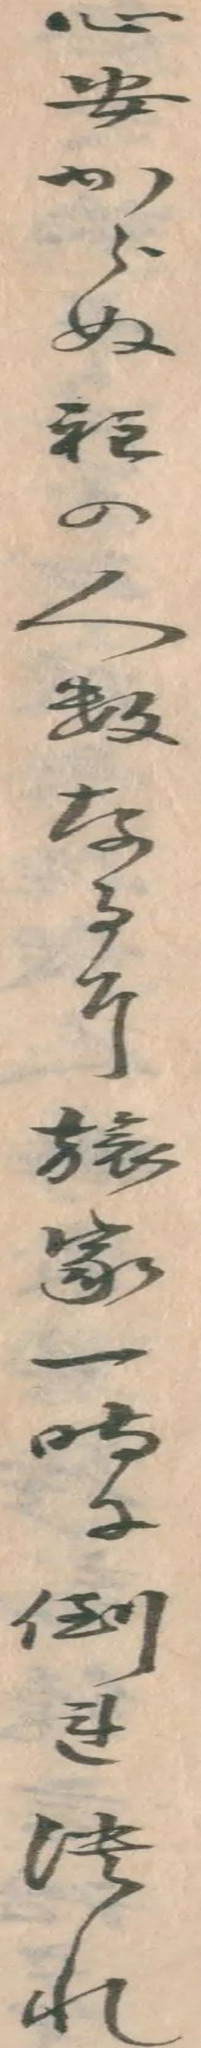心安からぬ程之人数なるに旅家一時に倒れ潰れ

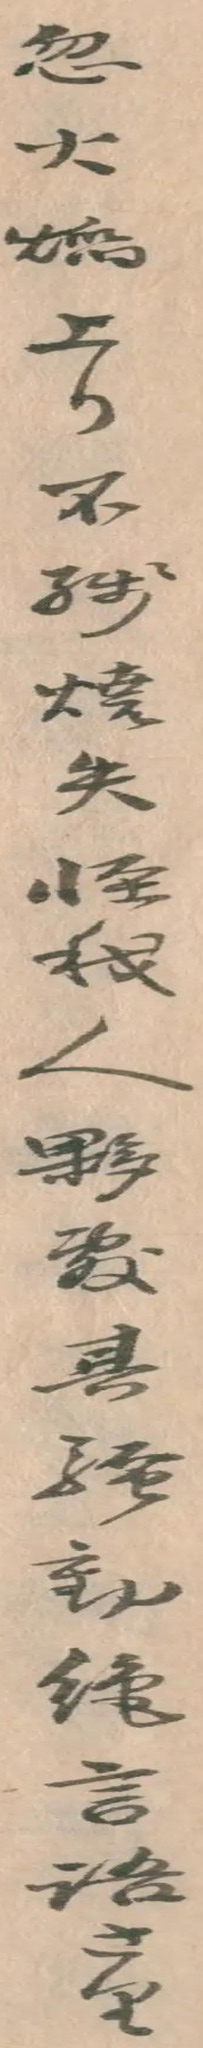忽火燃上り不残焼失怪我人夥敷其騒動絶言語さり
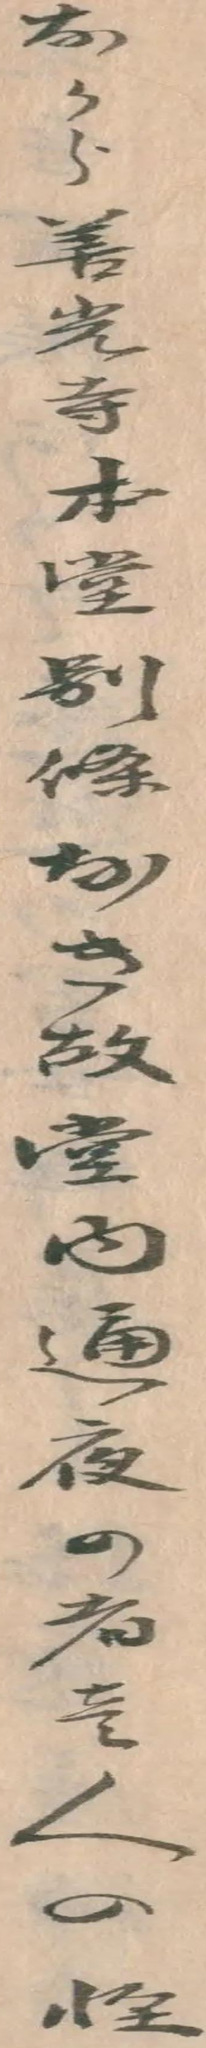なから善光寺本堂別条なき故堂内通夜の者壱人の怪
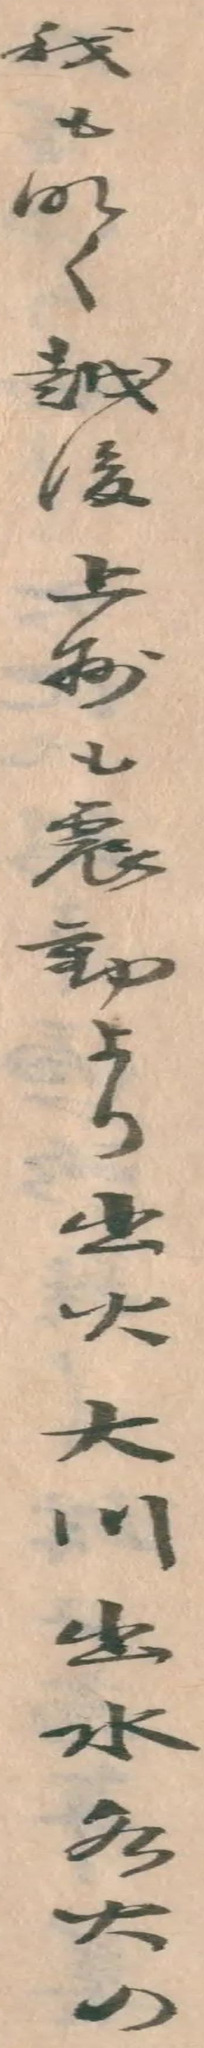我もなく越後上州も震動より出火大川出水水火の
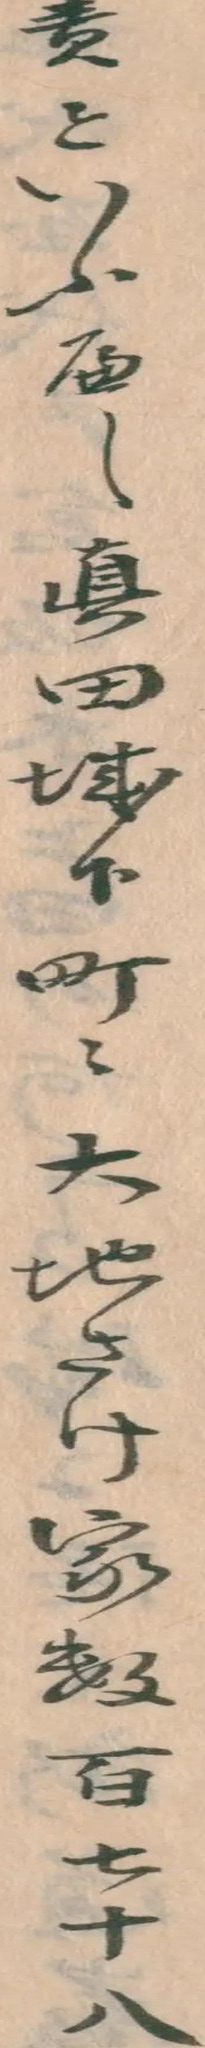責といふへし真田城下町之大地さけ家数百七十八
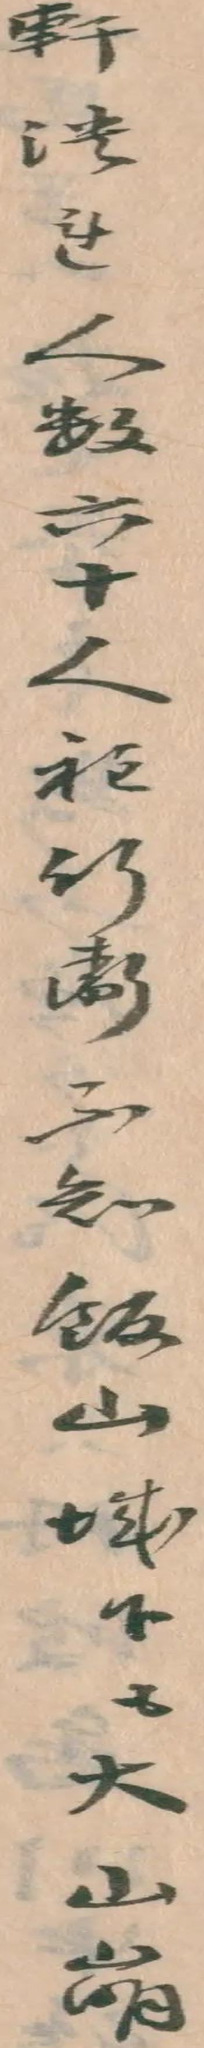軒潰れ人数六十人程行衛不知飯山城下も大山崩
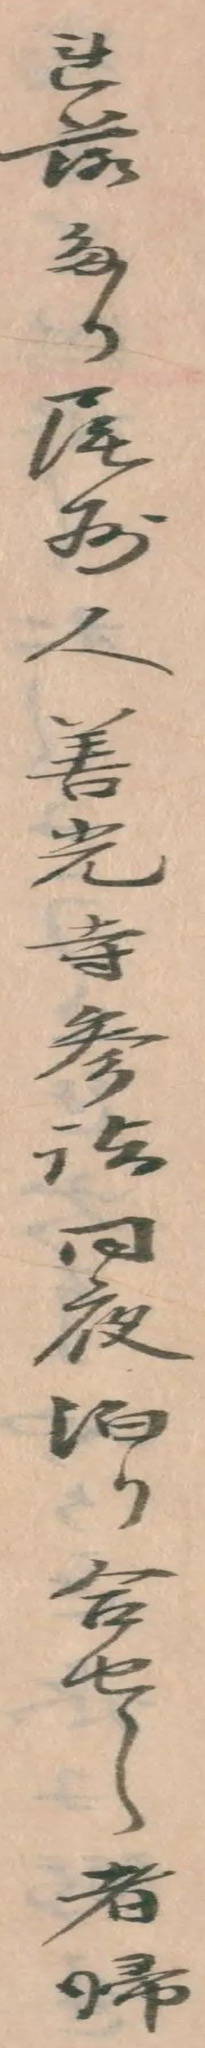れ落たり尾州人善光寺参詣同夜泊り合せし者帰
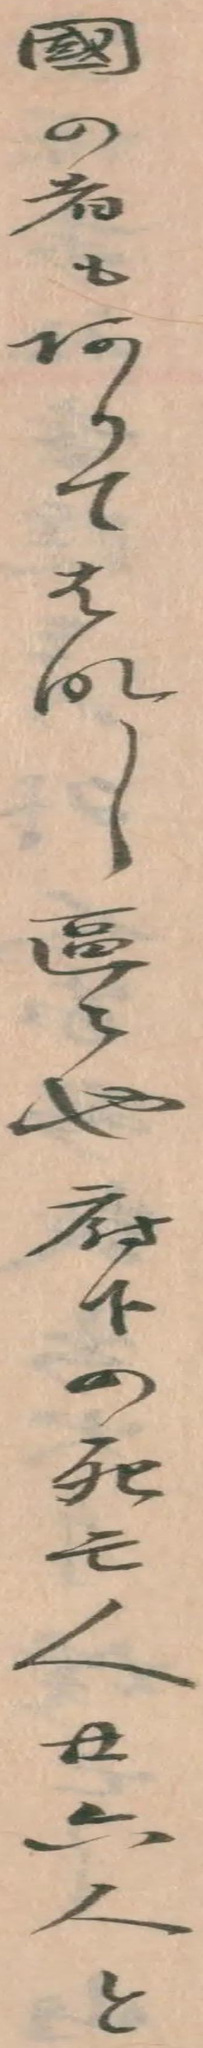国之者もありて咄區々也府下の死亡人廿六人と
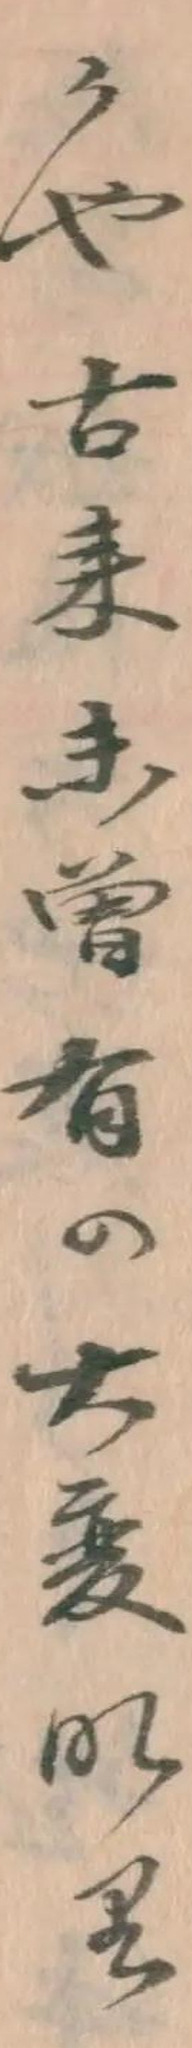かや古来未曽有の大変なり
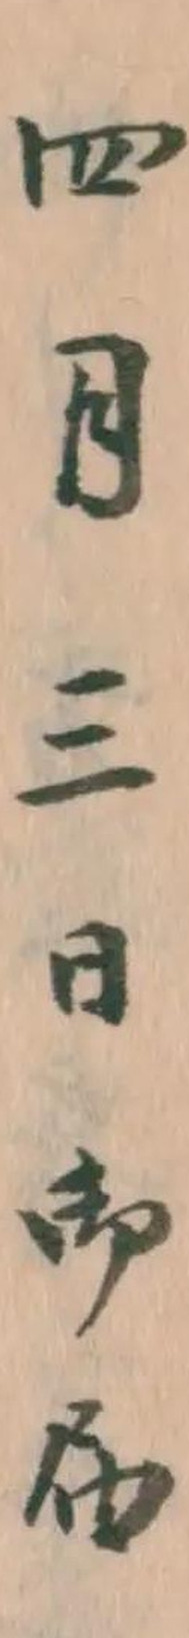四月三日御届
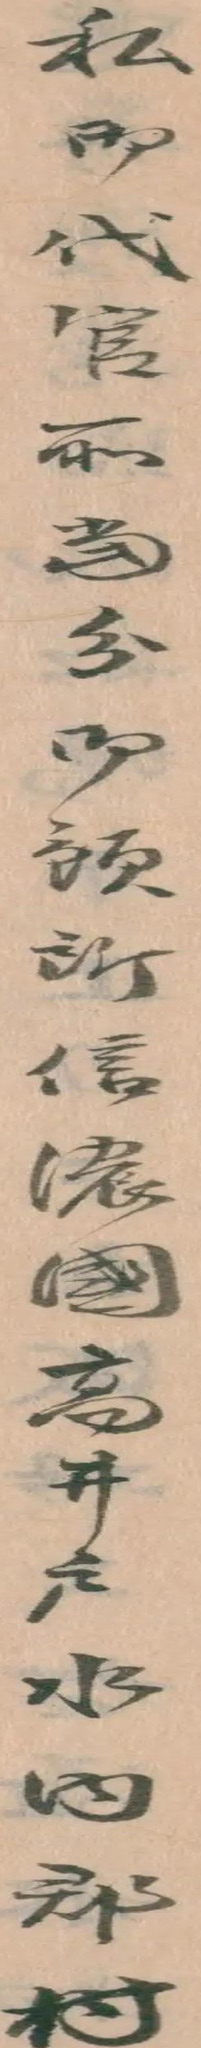私御代官所当分御預所信濃国高井戸水内郡村
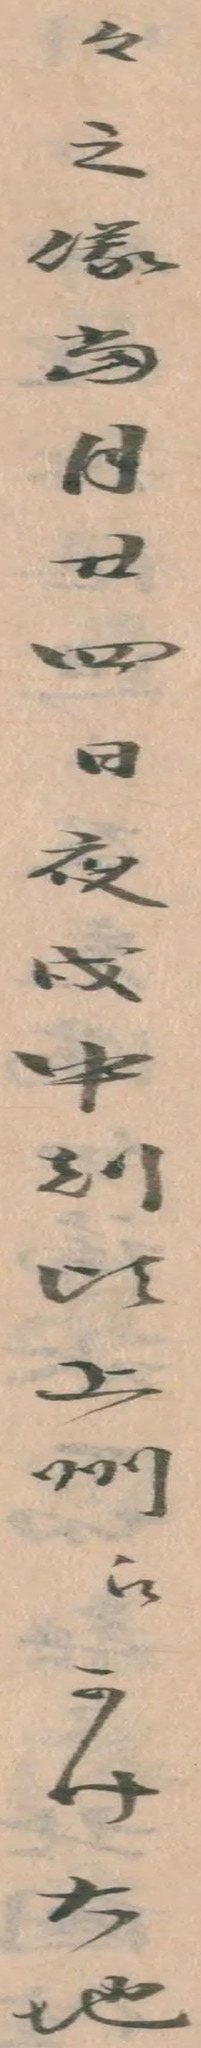々之儀当月廿四日夜戌中刻比上州江かけ大地
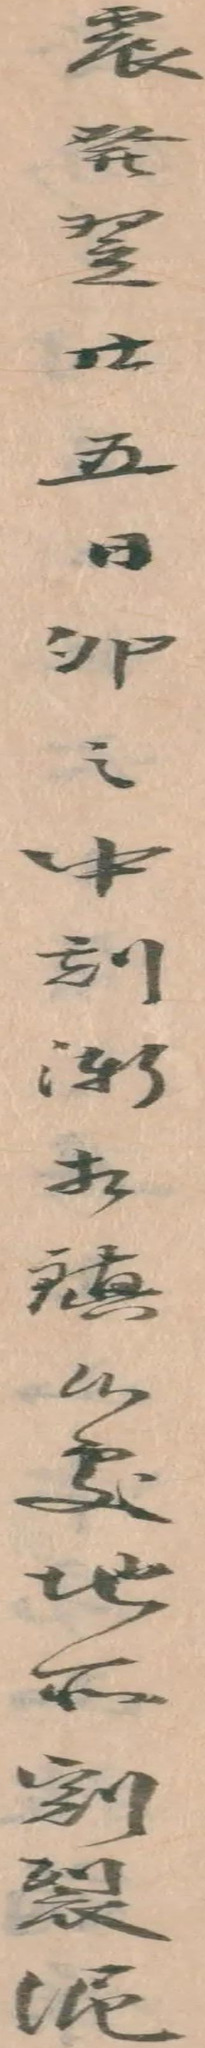震発翌廿五日卯之中刻漸相鎮候処地所割裂泥
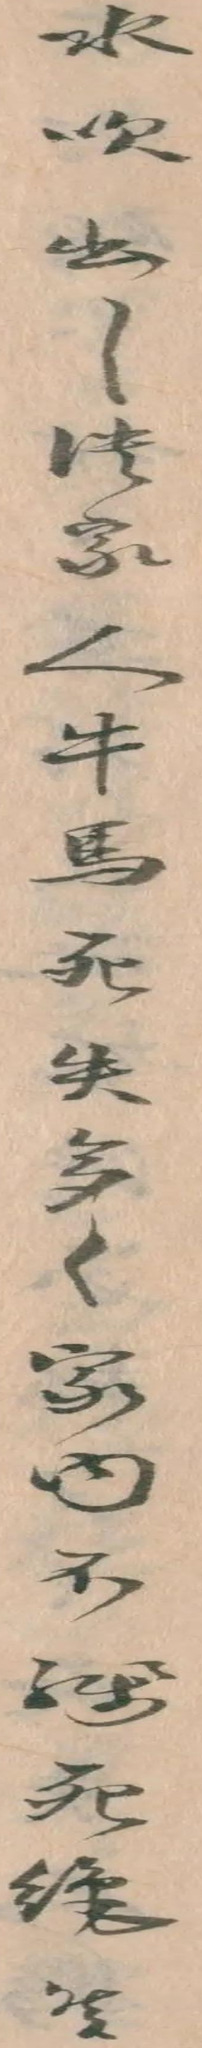水吹出し潰家人牛馬死失多く家内不残死絶候
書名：地災撮要. 巻3(地震之部)-巻4(噴火之部)
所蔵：国立国会図書館 National Diet Library, JAPAN
